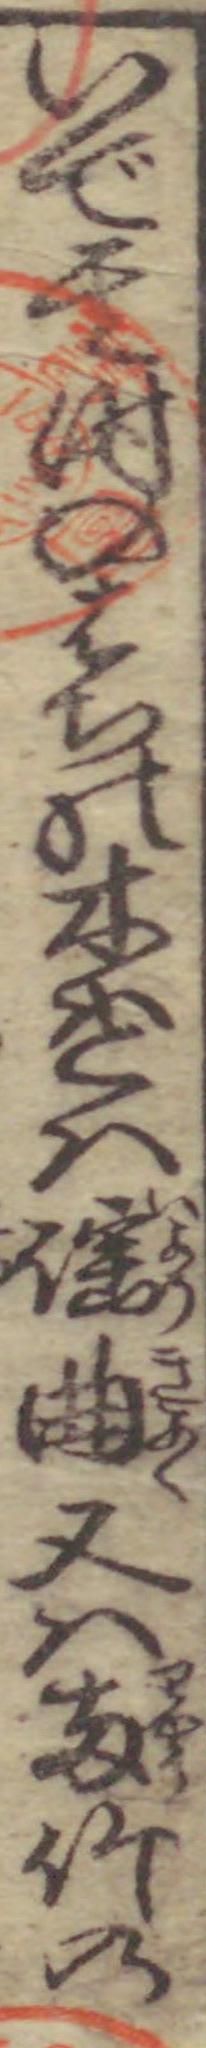いで其時のはちの木はとは謡曲又は両竹の
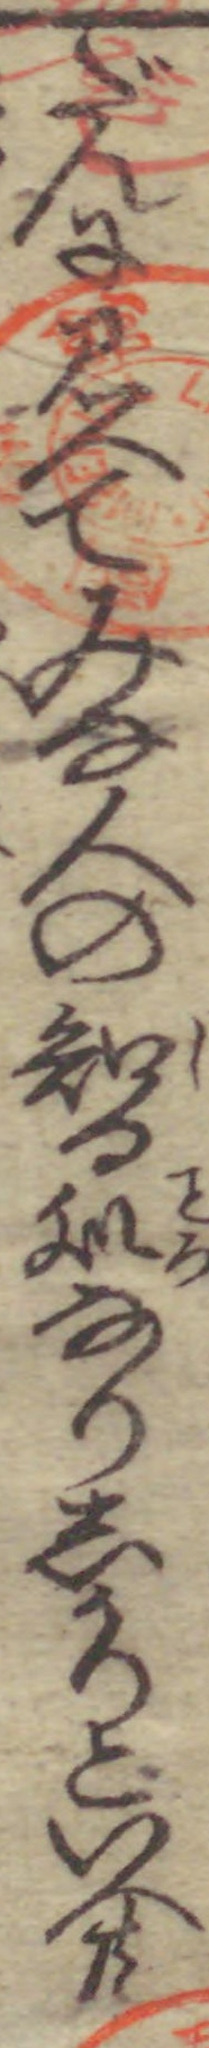だんに見へてみる人の知る処なりしかりといへ共
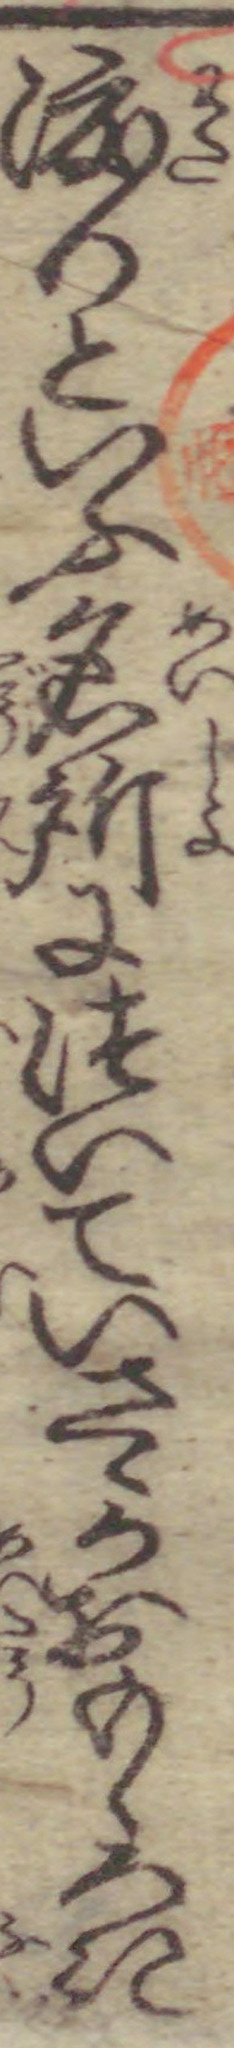渡りといふ名所についていさゝかおもしろき
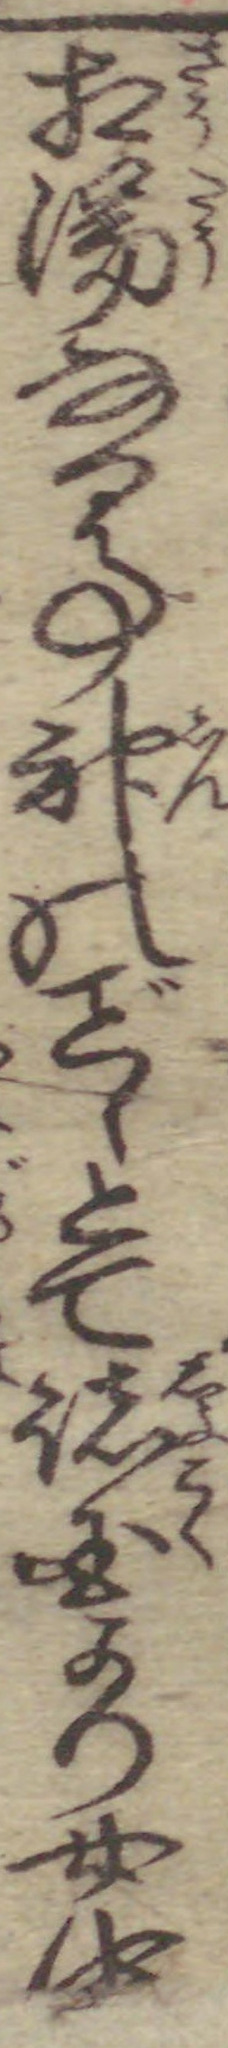相湯なる事神のごとしとて諸国より女
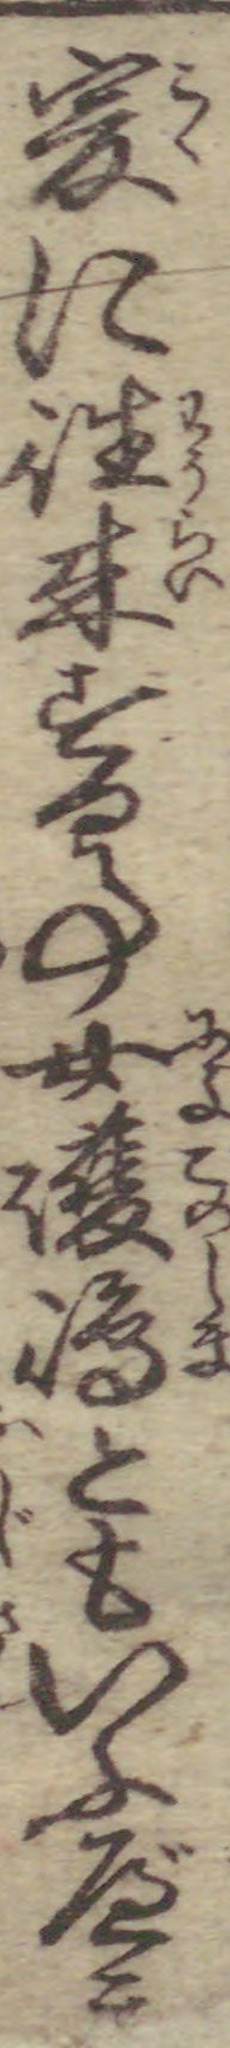爰に往来する事女護嶋ともいふべ
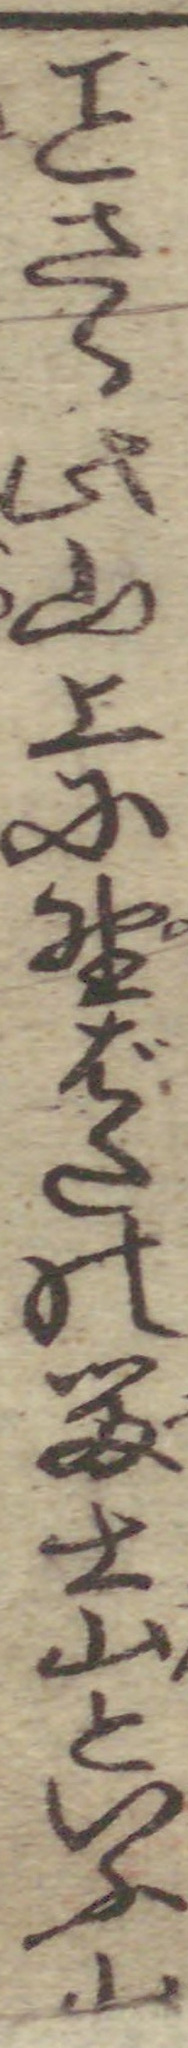ことさら此山上に野ばたの富士山といふ
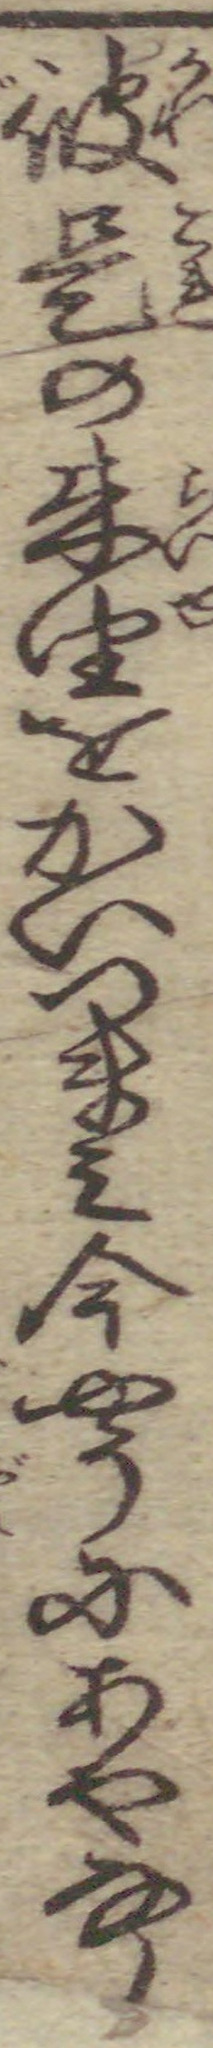彼是の来由をかいつまみ今やうにあやなし
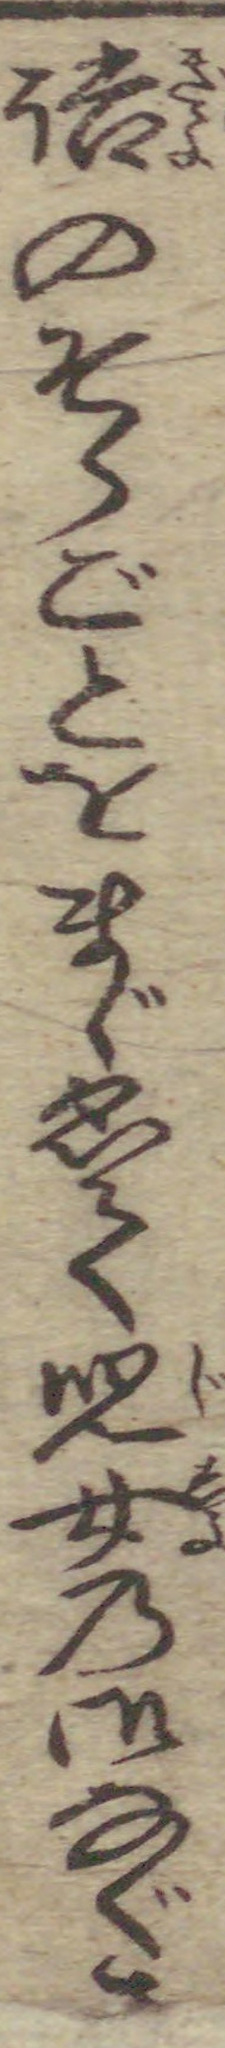語のそらごとをまじゑて児女のなぐ

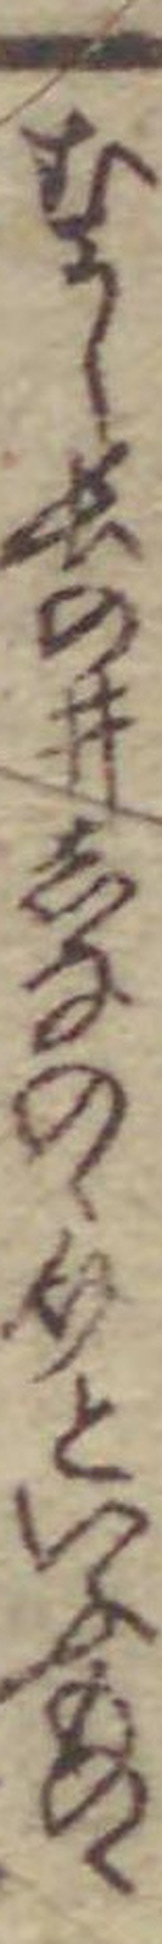むかし長の井しなのゝ介といふものゝ
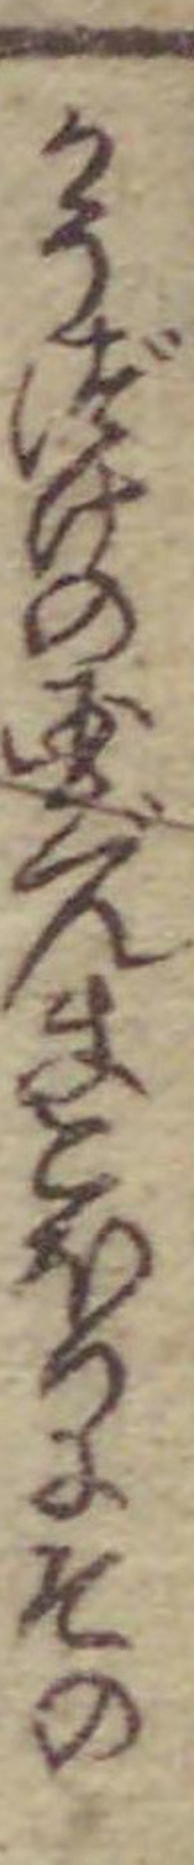かうづけの国ぐんまこほりにその
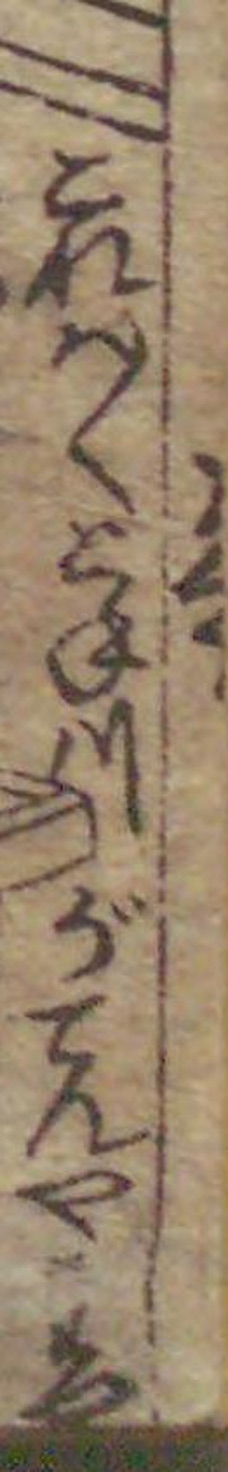これは〳〵とね川がてんやわや
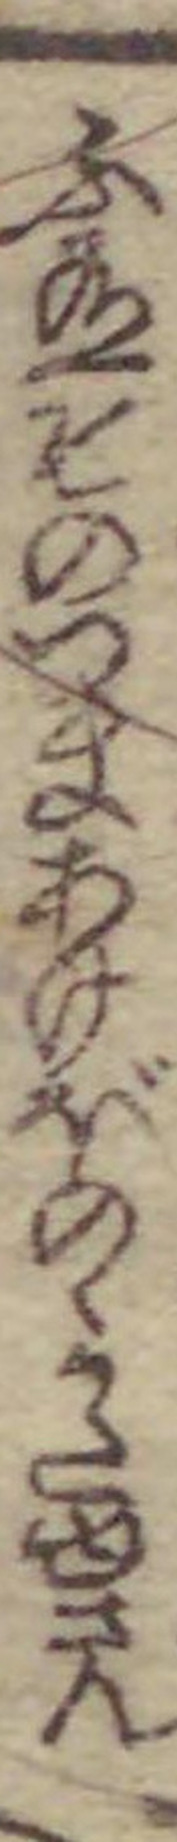ふ有そのつまあけぼのゝかたゆさん
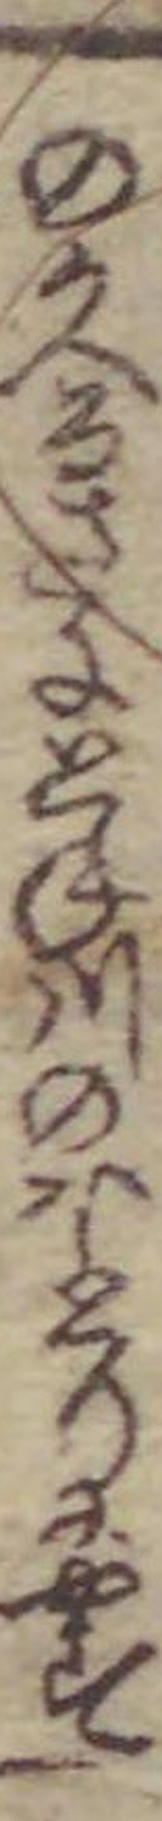のかへるさにとね川のほとりにやす
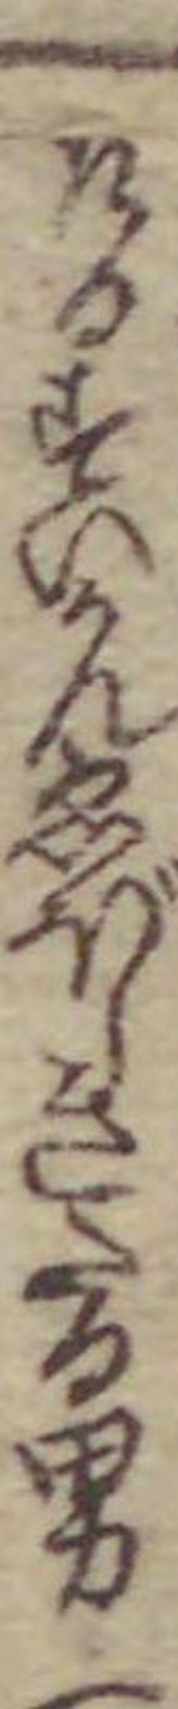けるすいかんゑぼしきたる男
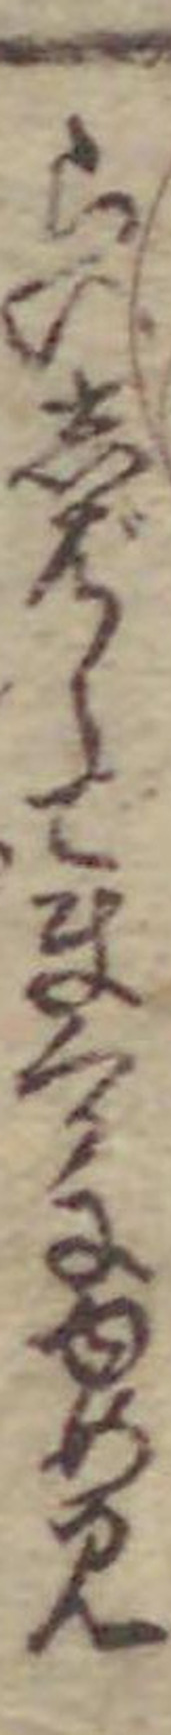らいしば〳〵てまくらにゆめ見
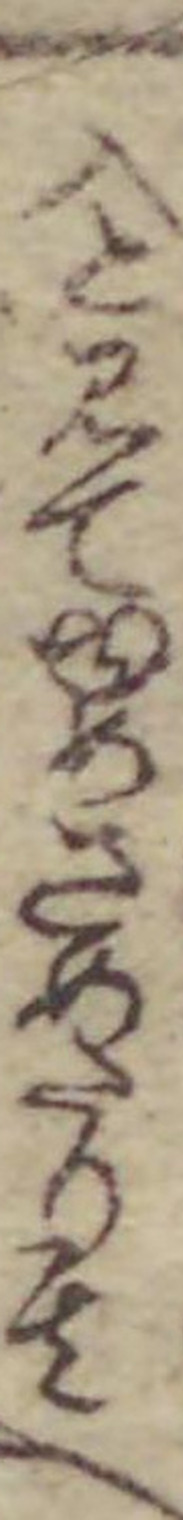入と見てゆめさめたり其
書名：娜二代鉢木 5巻
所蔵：国立国会図書館 National Diet Library, JAPAN
